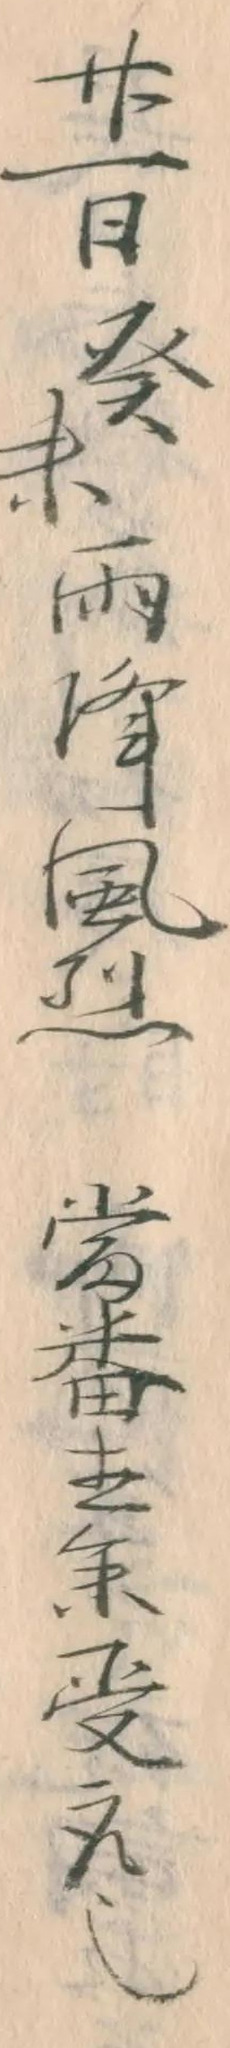廿一日癸両降風烈當番直参受取也
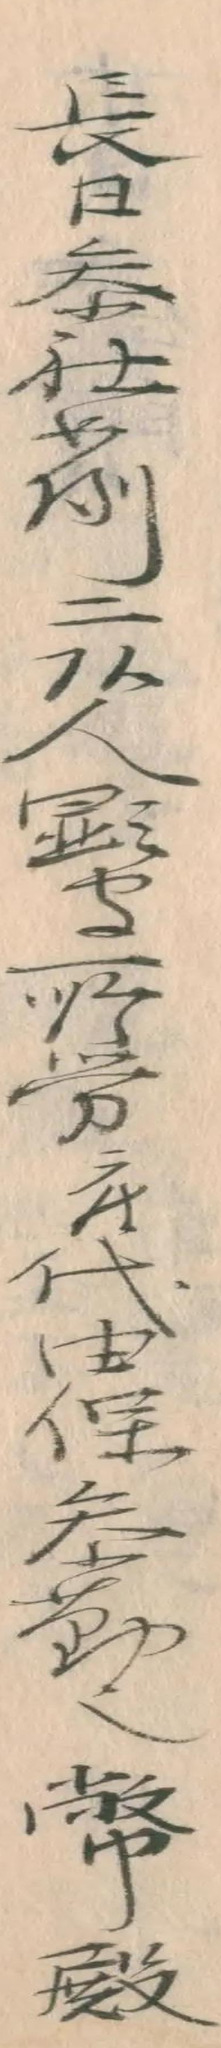一長日参社如例二頭人顕守所労ニ付代由保参勤也幣殿
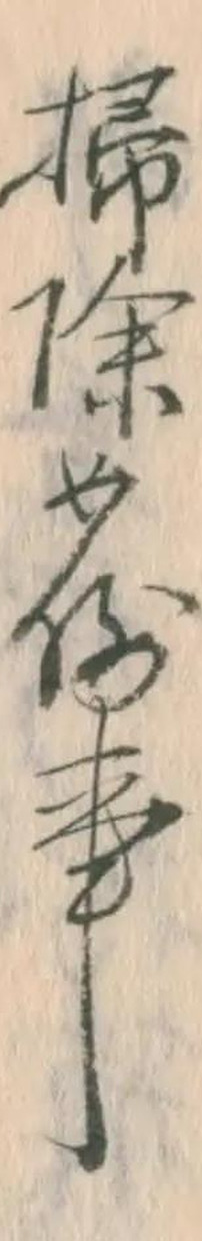掃除如例事
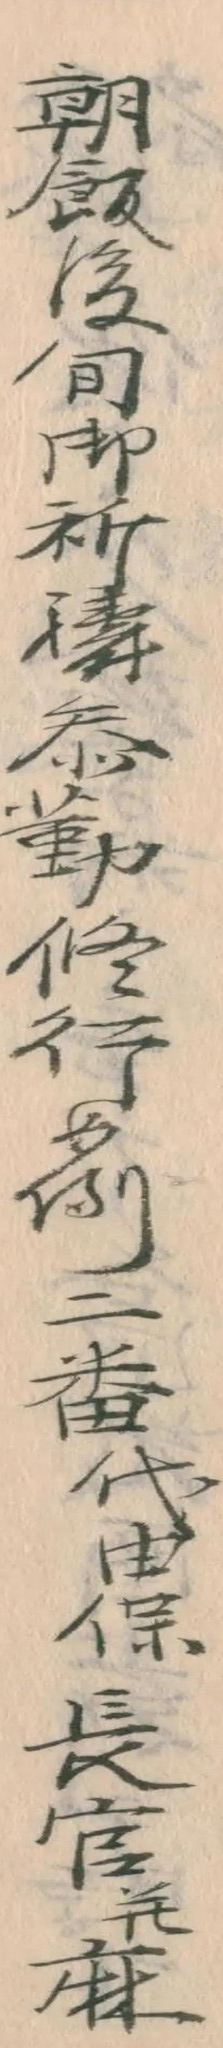一朝飯後旬御祈祷参勤修行如例二番代由保長官并麻
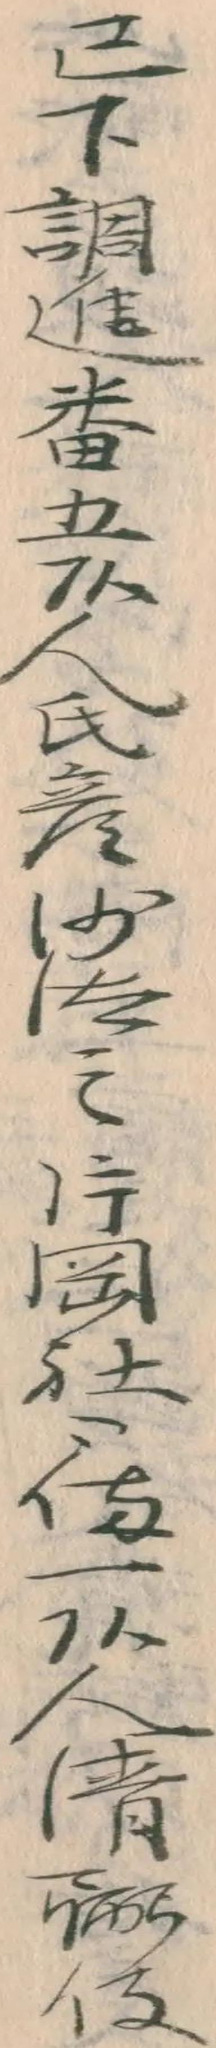已下調進番五頭人民彦沙汰之片岡社御備一頭人清弼役
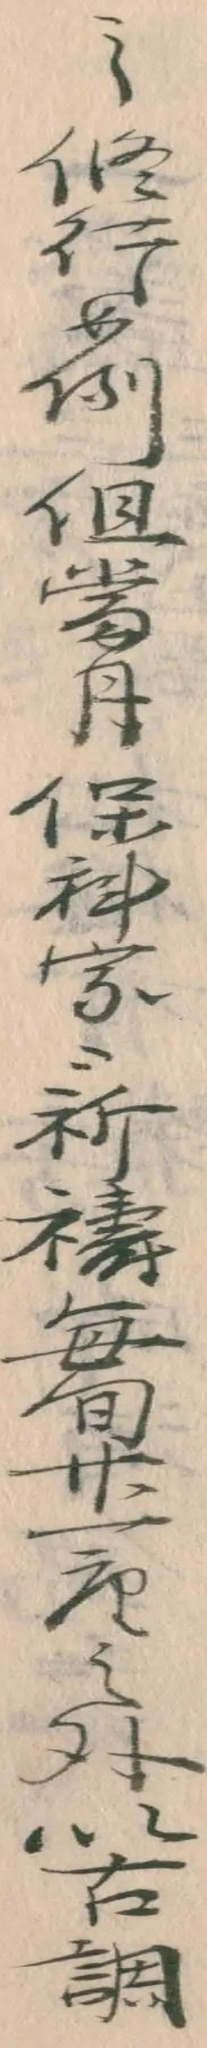之修行如例但當月保科家御祈祷毎旬廿一座之外以古調
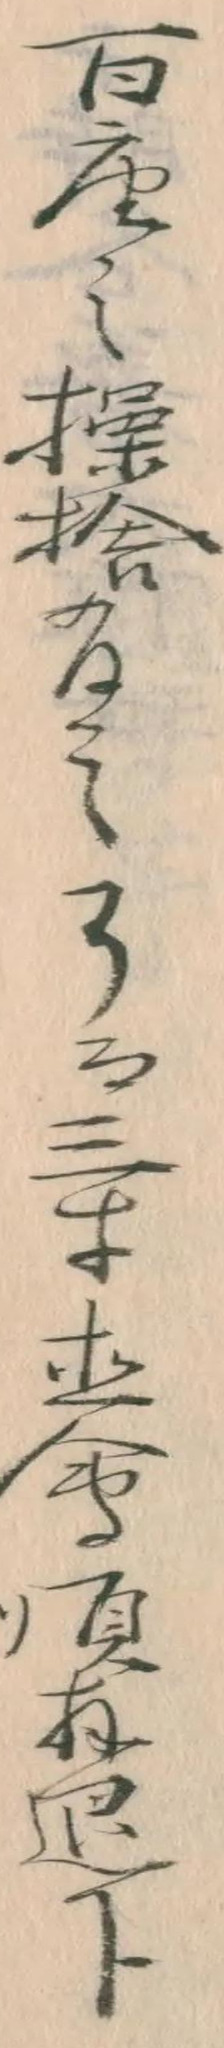百座之操捨有之了而三寸直會順退下
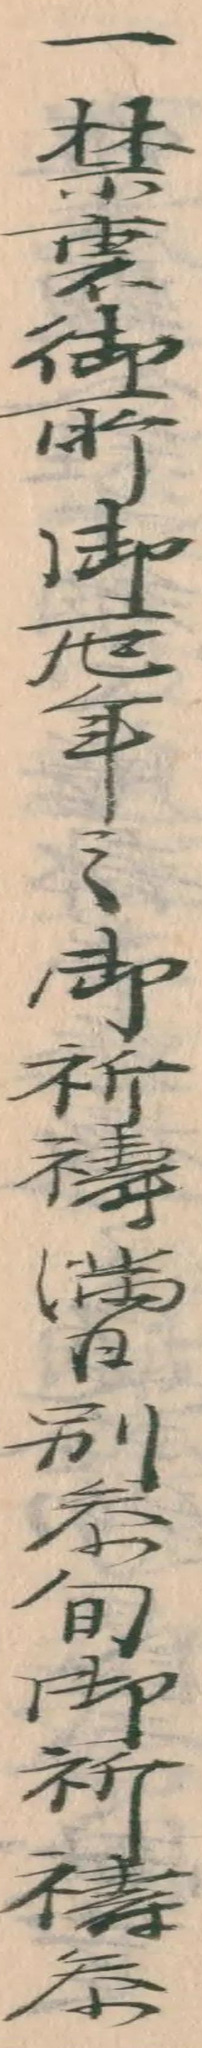一禁裏御所御厄年之御祈祷満日別参旬御祈禱祭
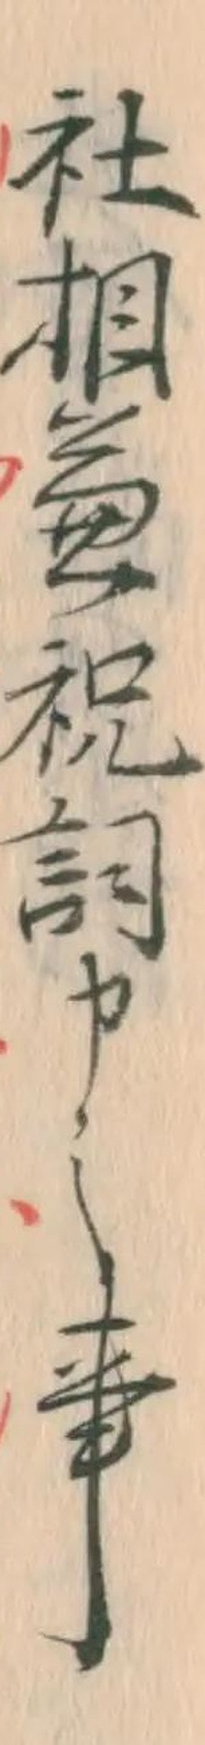社相兼祝詞申之事
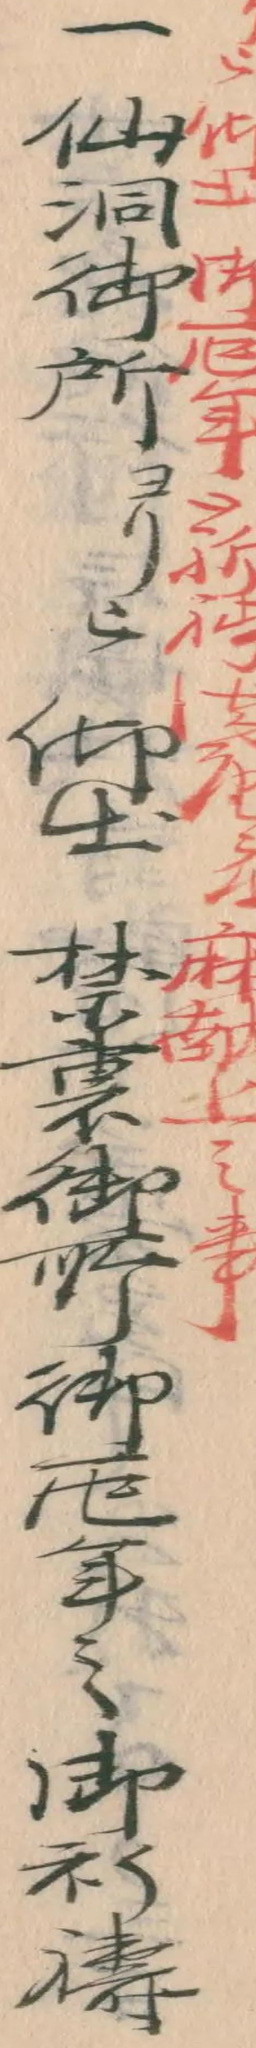一仙洞御所ヨリ被仰出禁裏御所御厄年之御祈祷
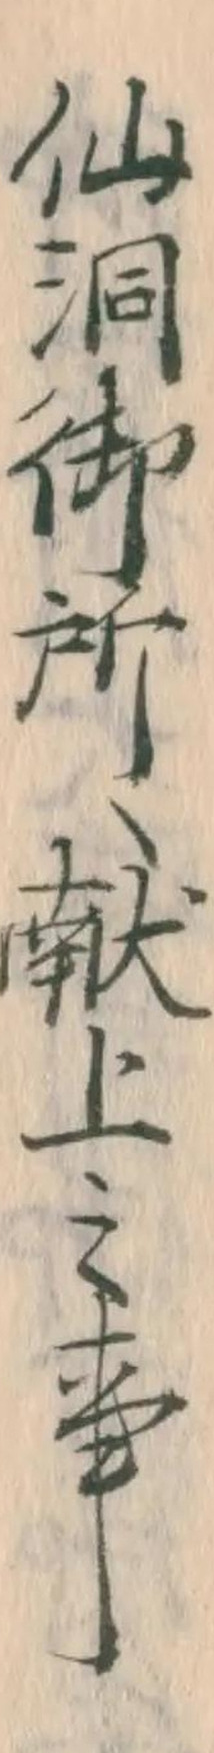仙洞御所へ献上之事
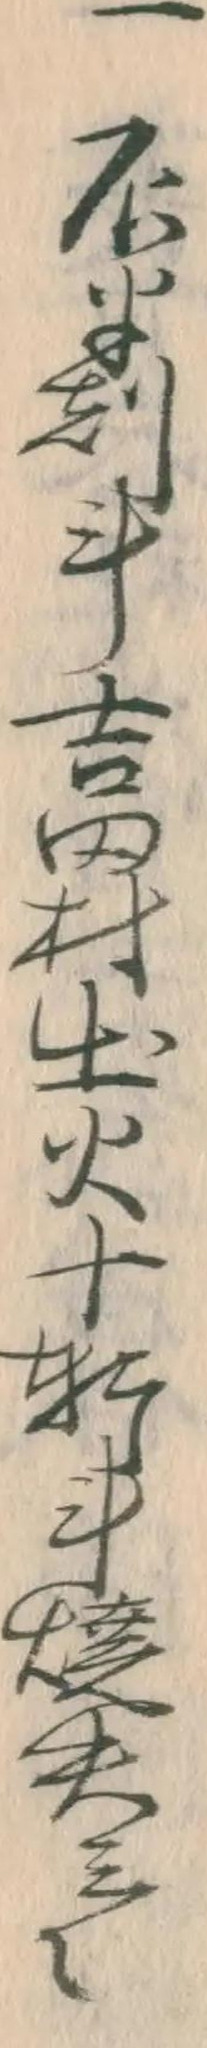一辰半刻斗吉田村出火十軒斗焼失云〻
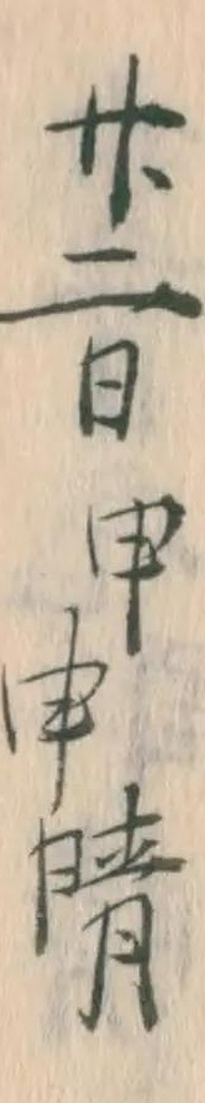廿二日甲申晴
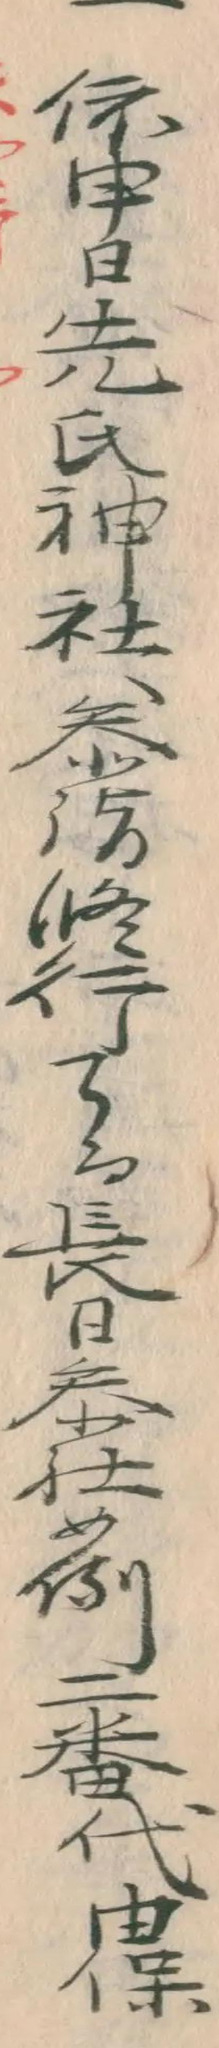一依申日先氏神社へ参詣修行了而長日参社如例二番代由保
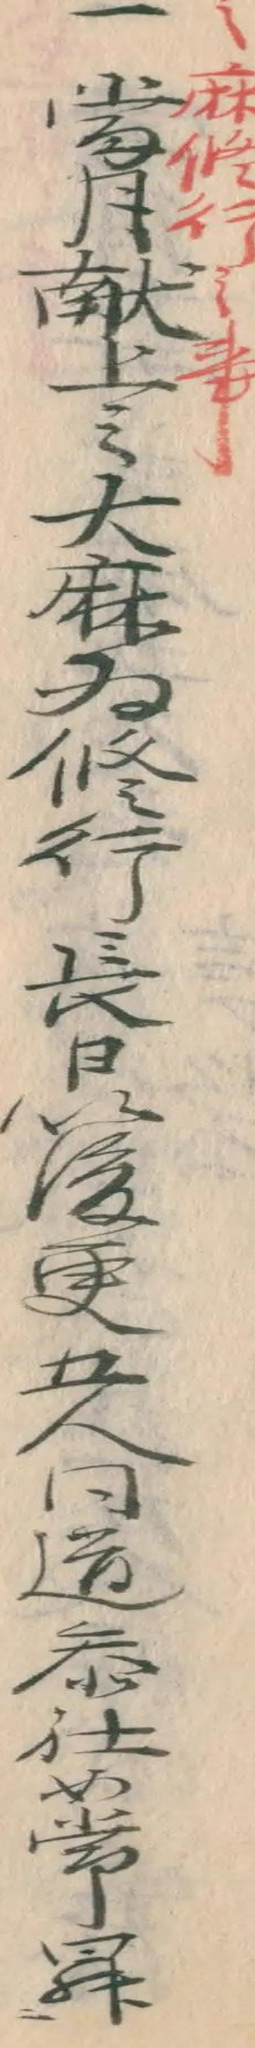一當月献上之大麻為修行長日以後更五人同道参社如常昇
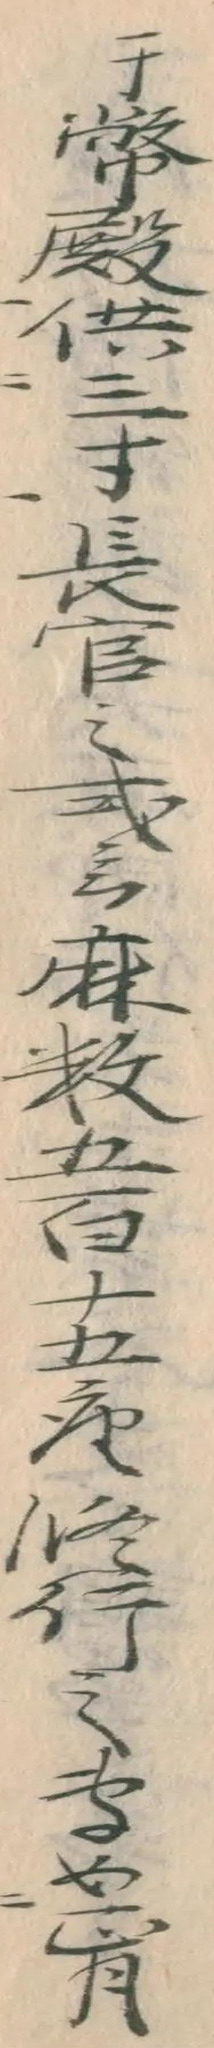于幣殿供三寸長官之式ニ而麻数五百十五座修行之處如正月
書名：賀茂社記録. 第73冊
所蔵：国立国会図書館 National Diet Library, JAPAN
